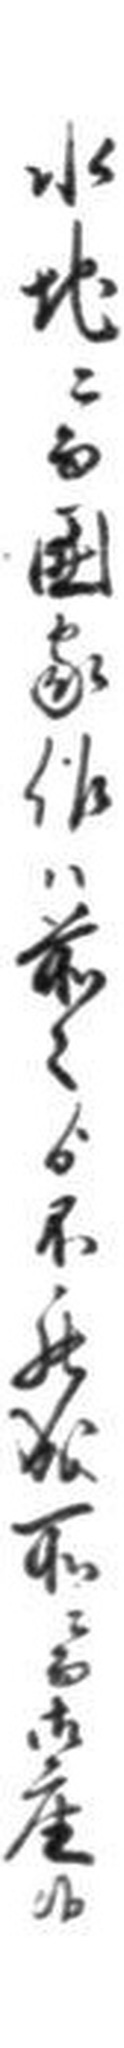水地ニ而囲家作ハ前々ゟ不罷成所ニ而御座候
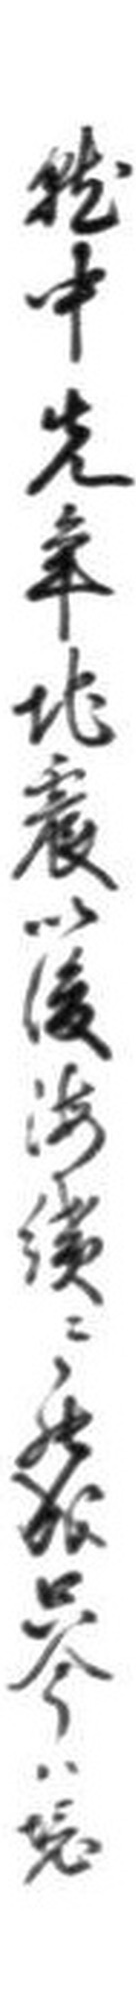就中先年地震以後海続ニ罷成只今ハ境
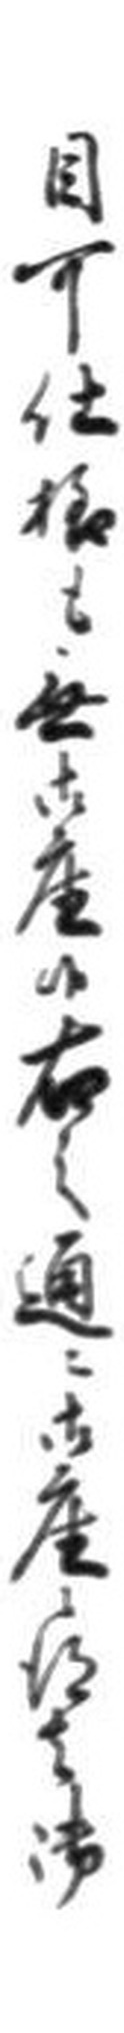目可仕様も無御座候右之通ニ御座候得者御
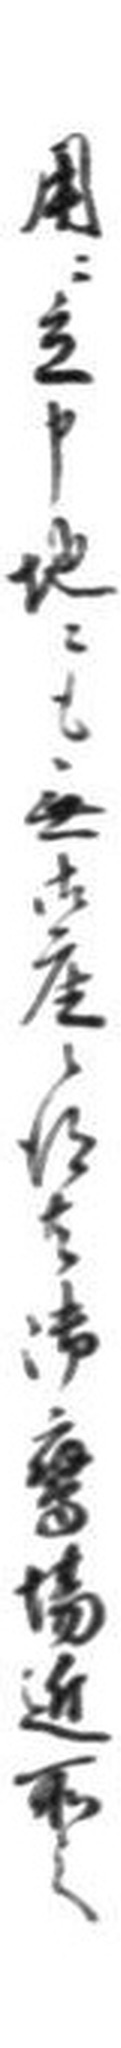用ニ立申地ニも無御座候得共御鷹場近所之
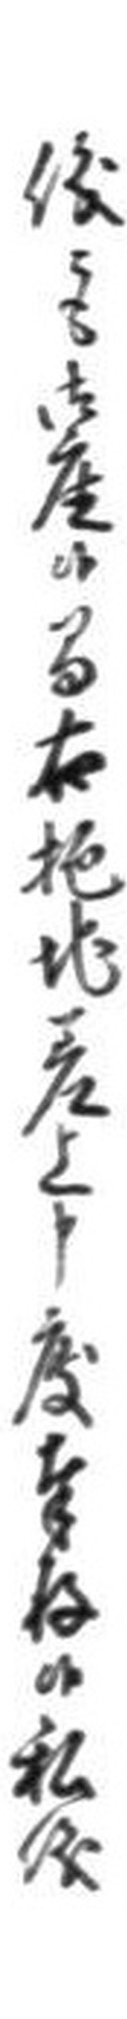儀ニも御座候間右抱地差上申度奉存候私儀
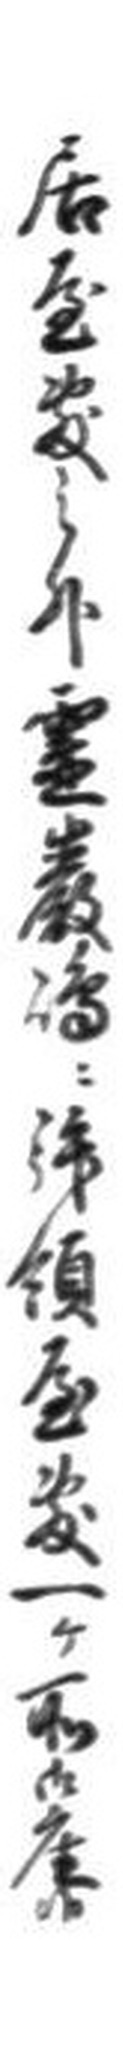居屋敷之外霊厳嶋ニ拝領屋敷一ケ所御座候
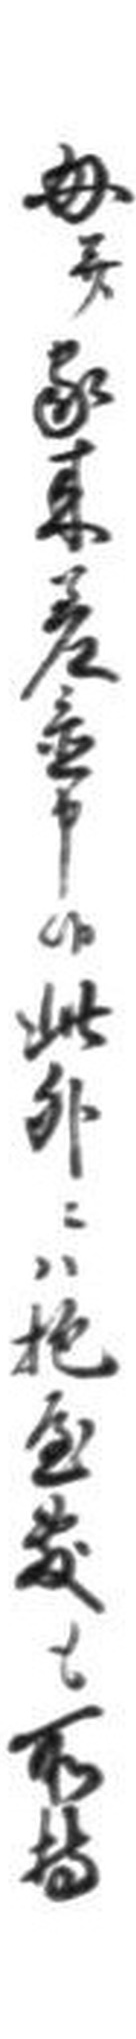母并家来差置申候此外ニハ抱屋敷も所持
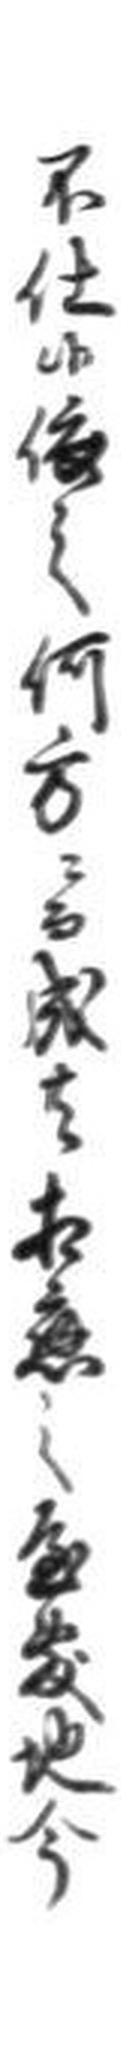不仕候依之何方ニ而成共相応之屋敷地今
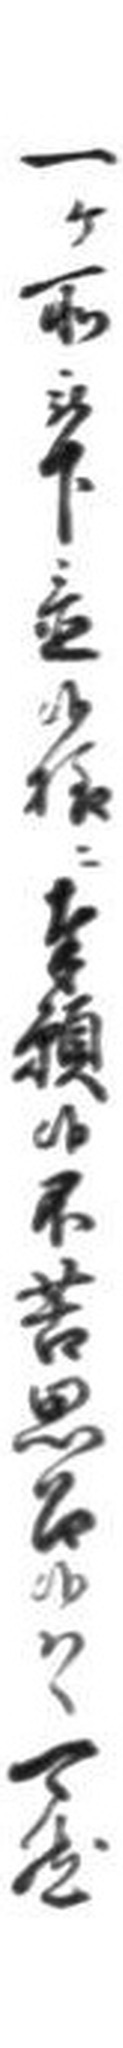一ケ所被下置候様ニ奉願候不苦思召候ハヽ可然
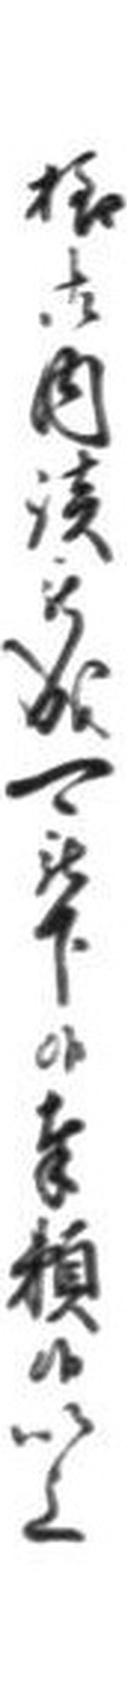様御内談被成可被下候奉願候以上

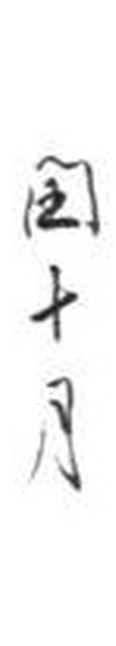閏十月
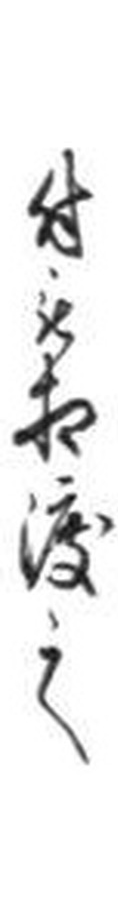付被相渡之
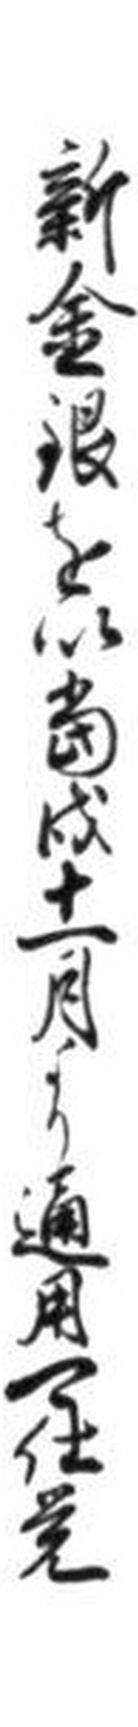新金銀を以当戌十一月より通用可仕覚
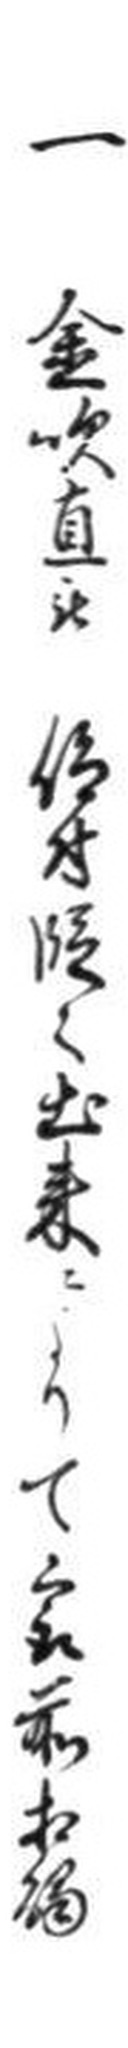一金吹直被仰付段々出来ニよりて最前相触
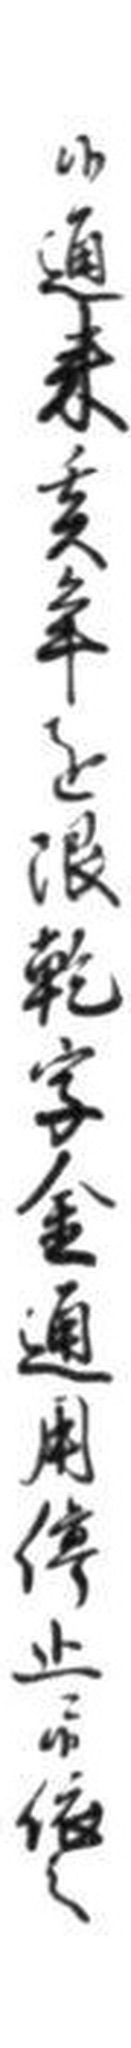候通来亥年を限乾字金通用停止ニ候依之
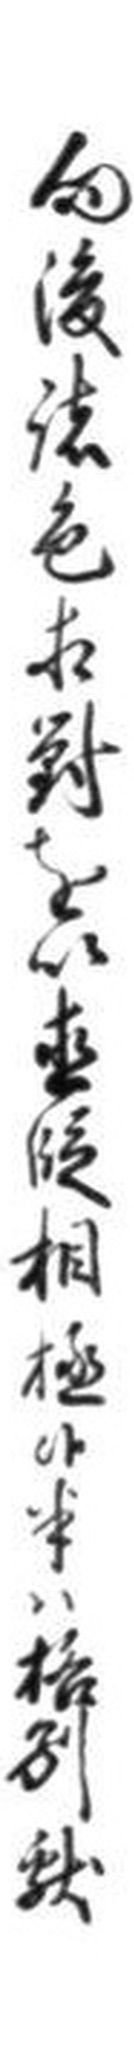向後諸色相対を以直段相極候半ハ格別献
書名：家譜 三十二 吉邦公 従享保二年到享保三年
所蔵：福井県文書館 Fukui Prefectural Archives
